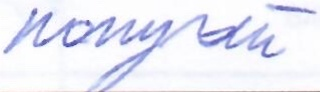попугай
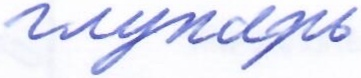глухарь
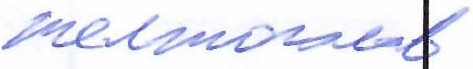желтоголов
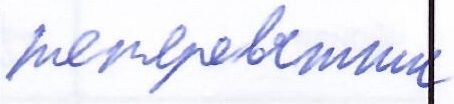тетеревятник
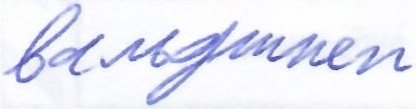вальдшнеп
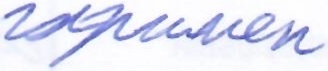гаринеп
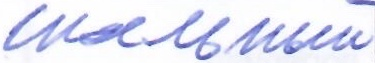скальный
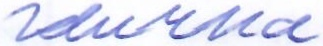гаичка
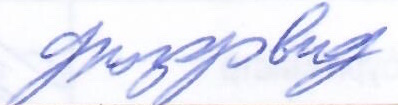дроздовид
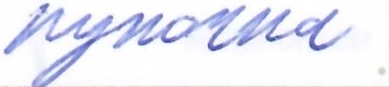пуночка
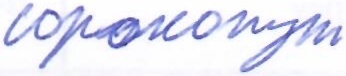сорокопут
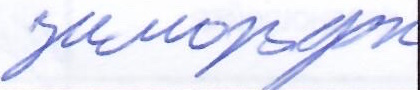зимордок
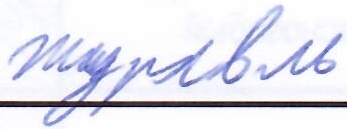журавль
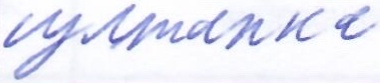султанка
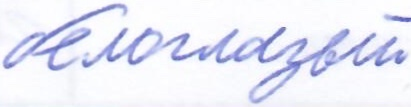белоглазый
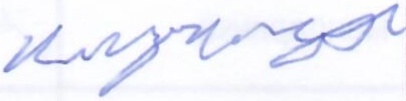клунца
